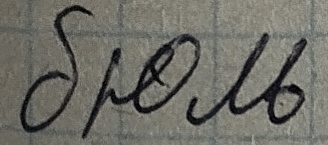бюль
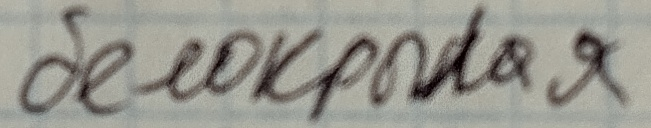белокрылая
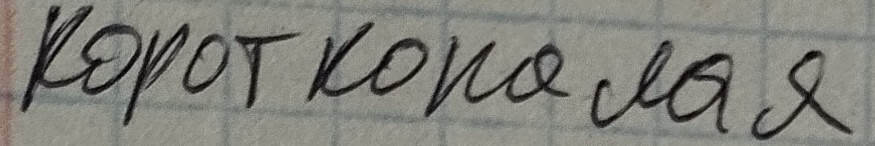короткопалая
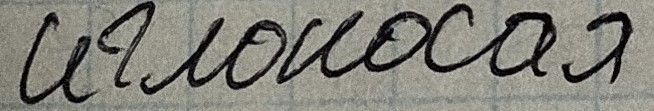иглоносая
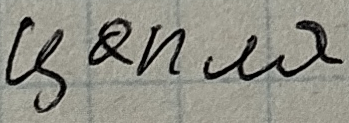цапля
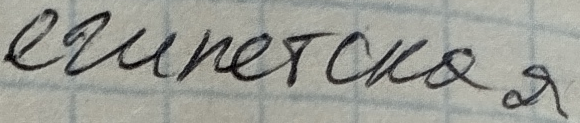египетская
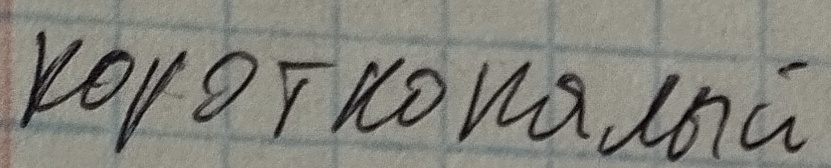короткопалый
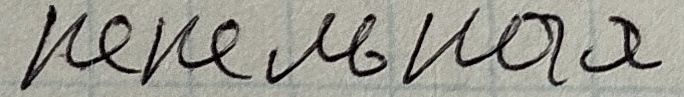пепельная
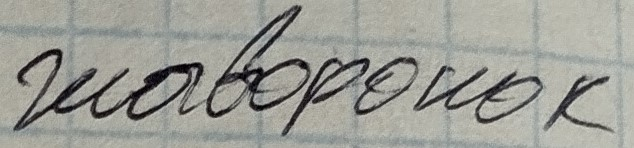жаворонок
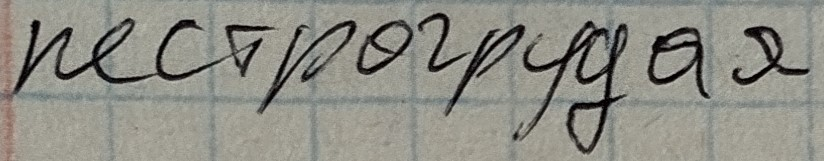пестрогрудая
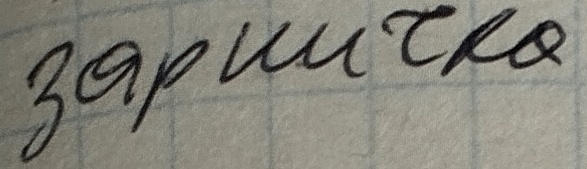зарничка
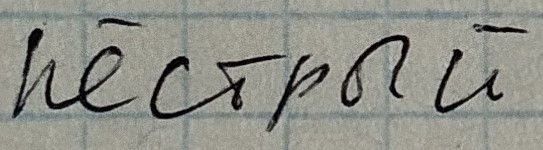пёстрый
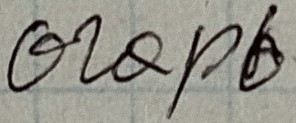огарь
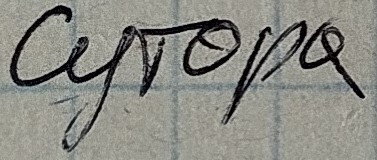сутора
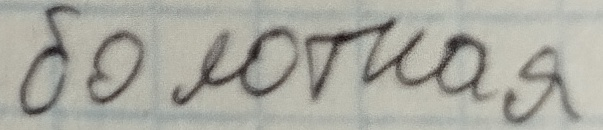бо лотная
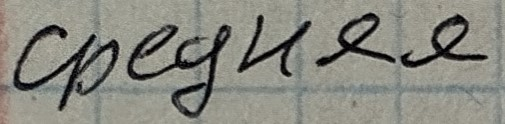средняя
